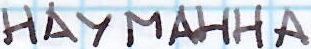науманна
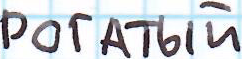рогатый
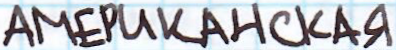американская
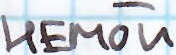немой
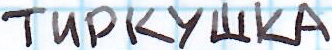тиркушка
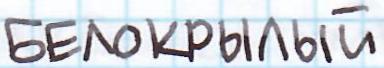белокрылый
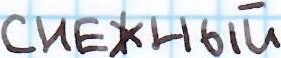снежный
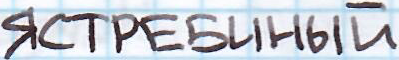ястребиный
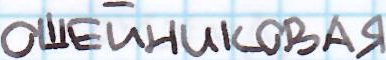ошейниковая
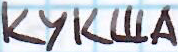кукша
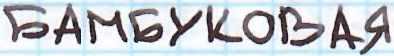бамбуковая
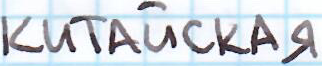китайская
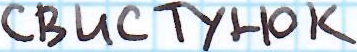свистунок
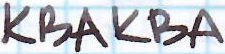кваква
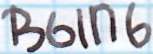выпь
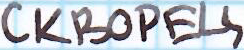скворец
